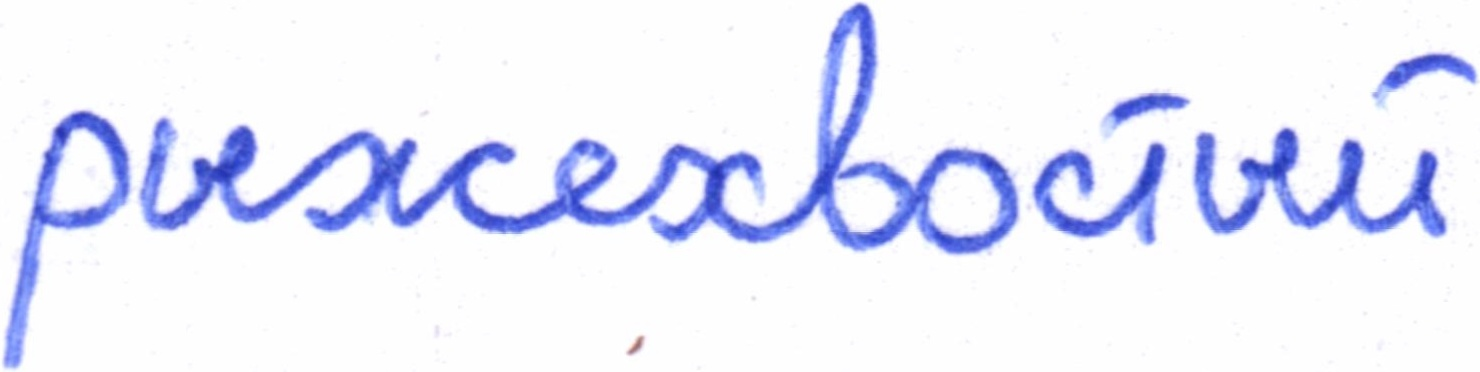рыжехвостый
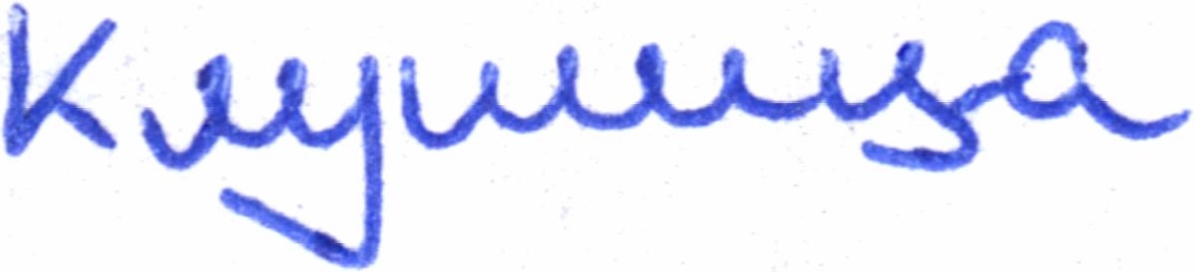клушица
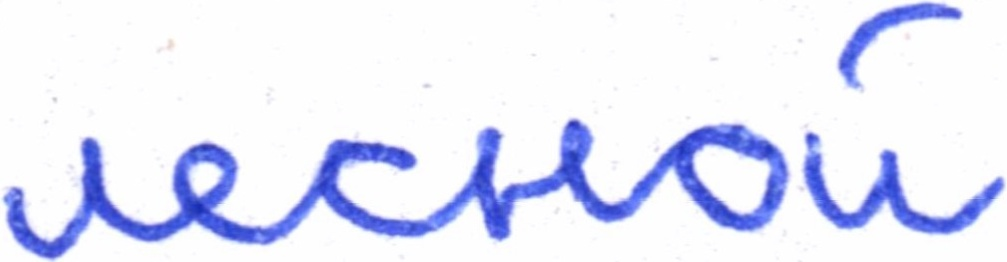лесной
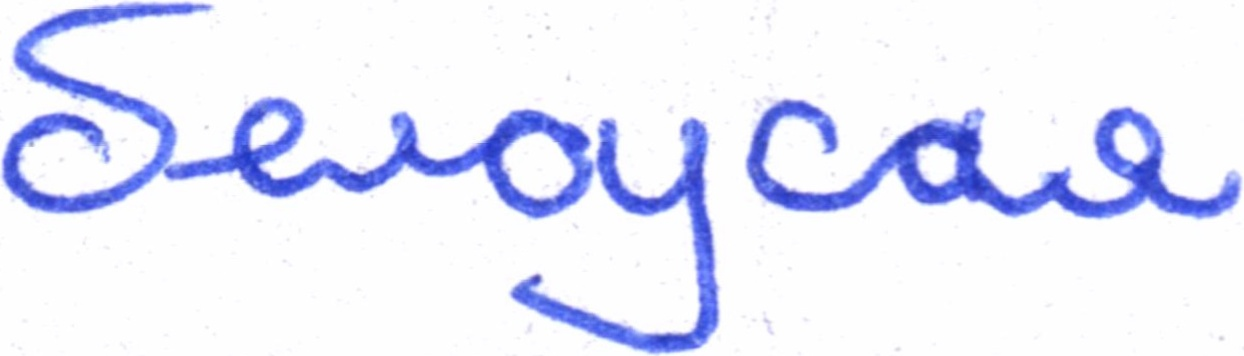белоусая
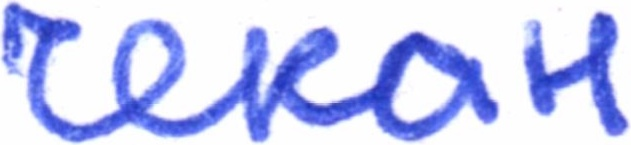чекан
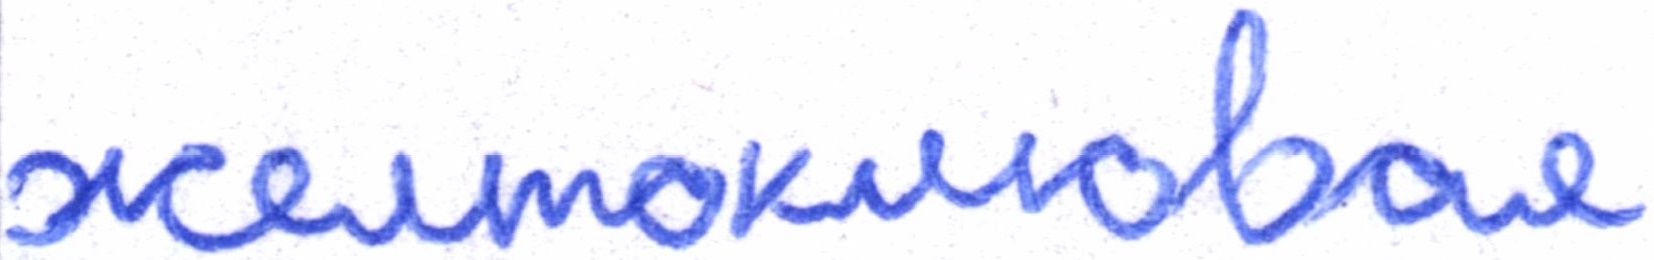желтоклювая
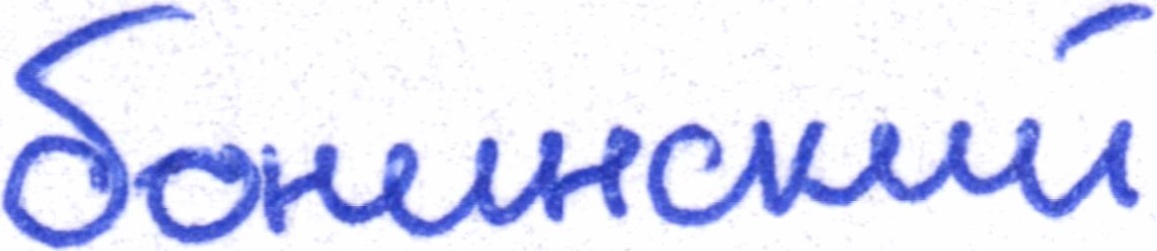бонинский
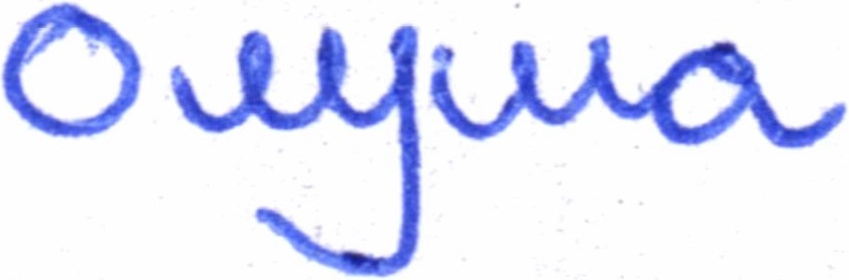олуша
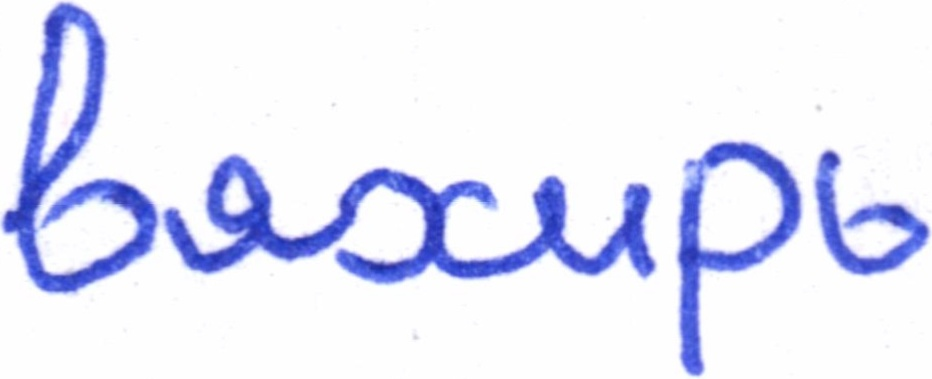вяхирь
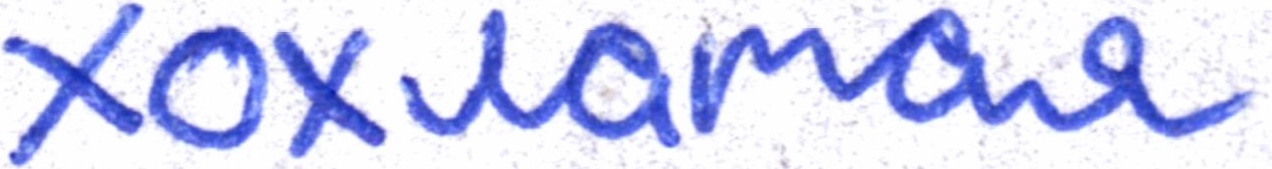хохлатая
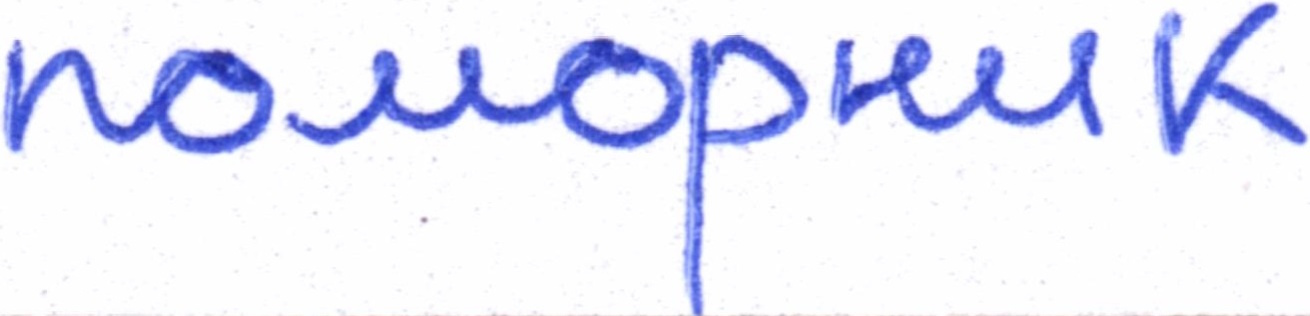поморник
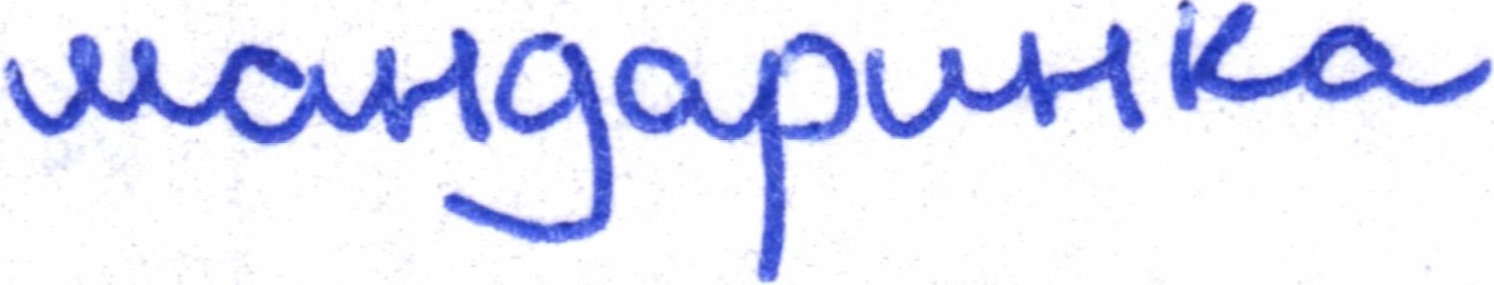мандаринка
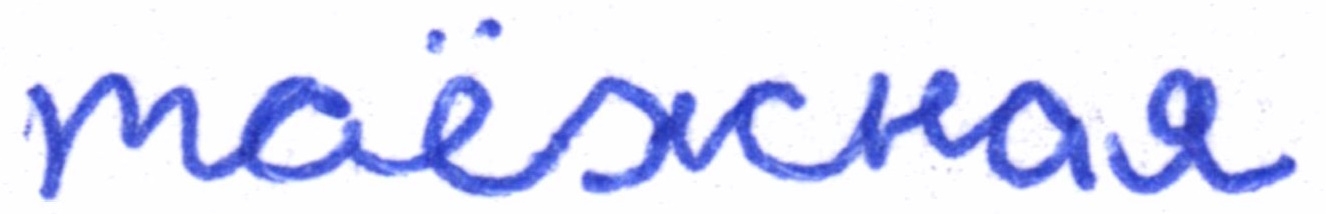таёжная
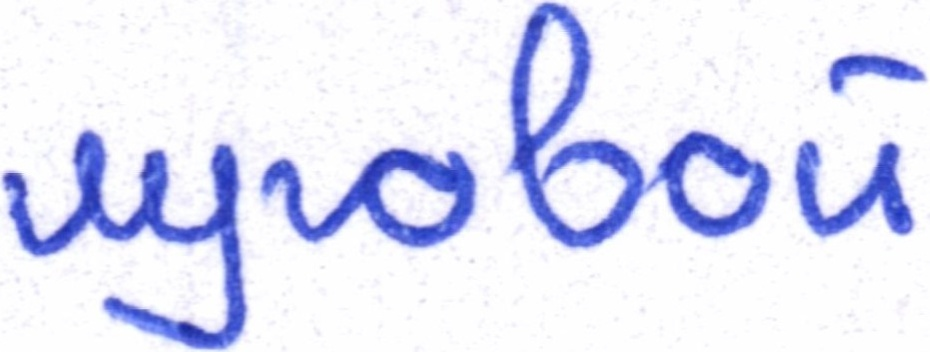луговой
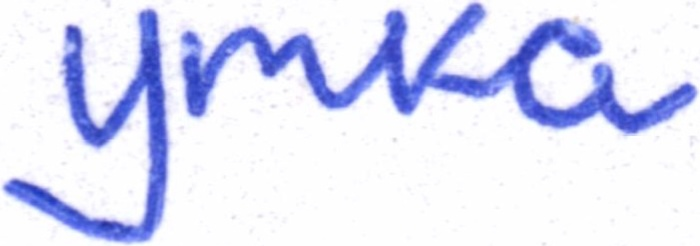утка
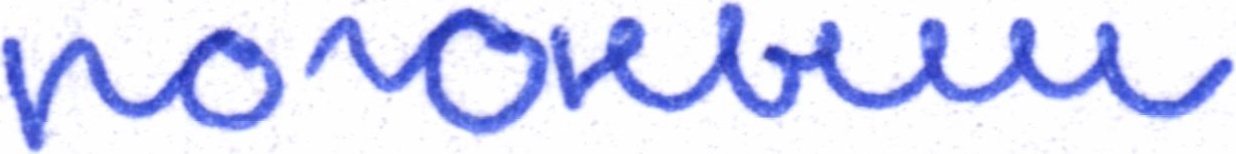погоныш
